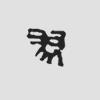翏
